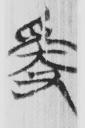爯
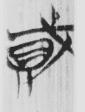貣
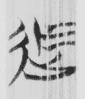{辶殳}
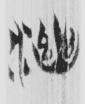{水幽}
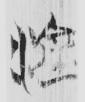塗
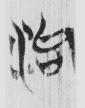{水句}
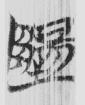{陽土}
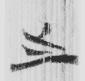之
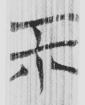{示工}
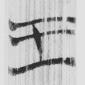王
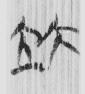{立大}
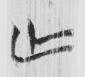亡
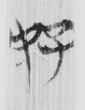好
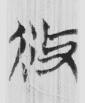攸
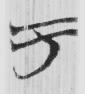于
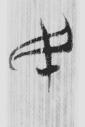民
